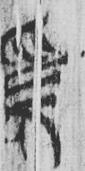○（奚）
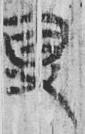○（得）
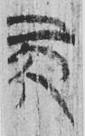而
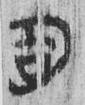固
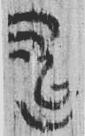水
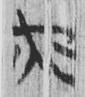火
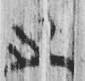之
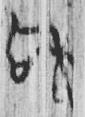和
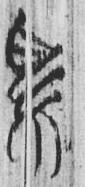○（奚）
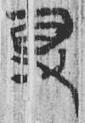○（得）
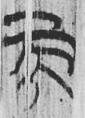而
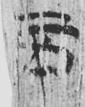不
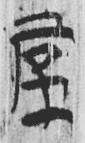危（詭）
